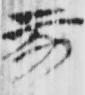亥
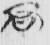君
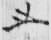之
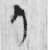人
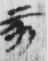亥
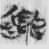囂
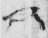尹
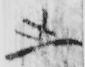之
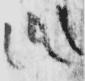州
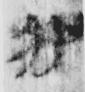加
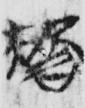○（胡）
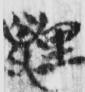○（貍）
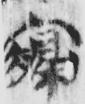寢
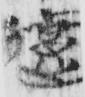遺
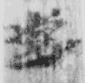喜
